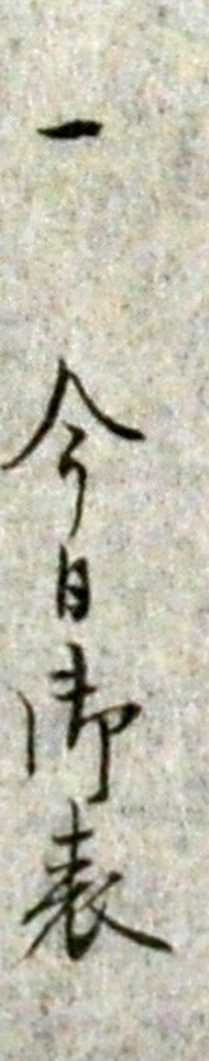一今日御表
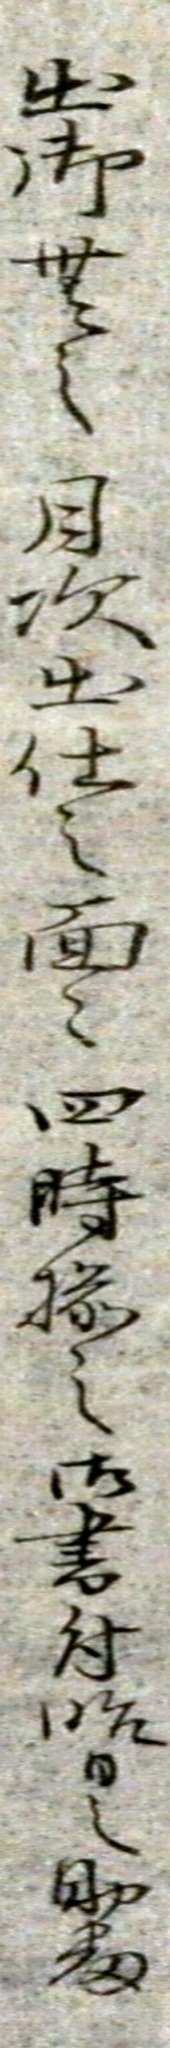出御無之月次出仕之面々四時揃之御書付昨日之助番
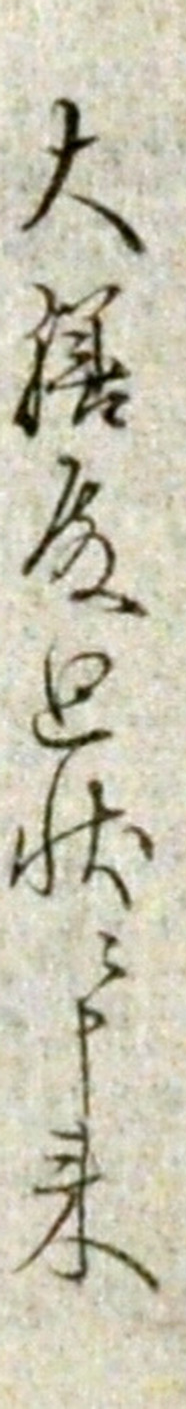大膳殿廻状ニ申来
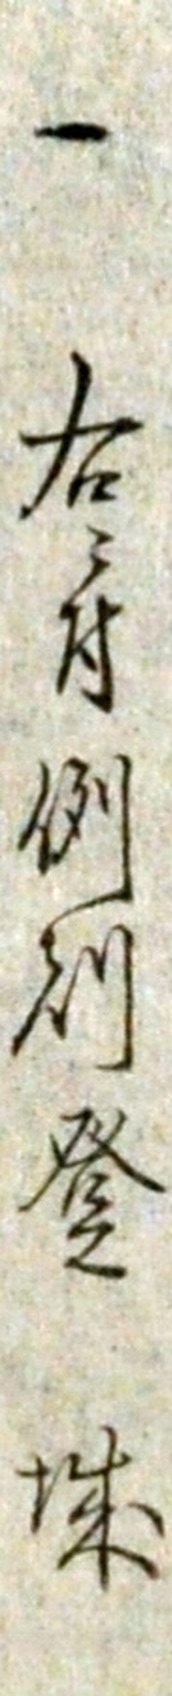一右ニ付例刻登城
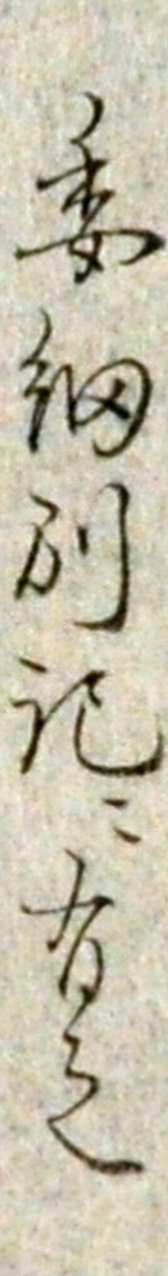委細別記ニ有之
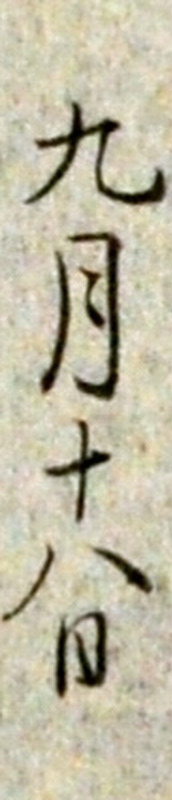九月十八日
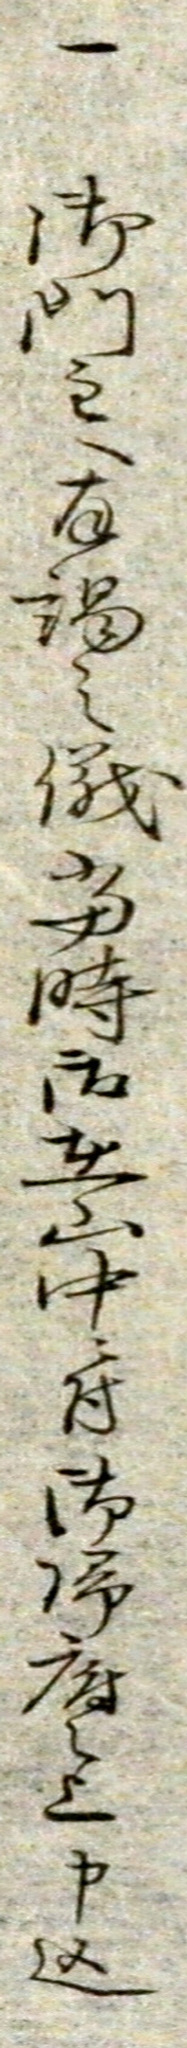一御門主へ拝謁之儀当時御在山中ニ付御帰府之上申込
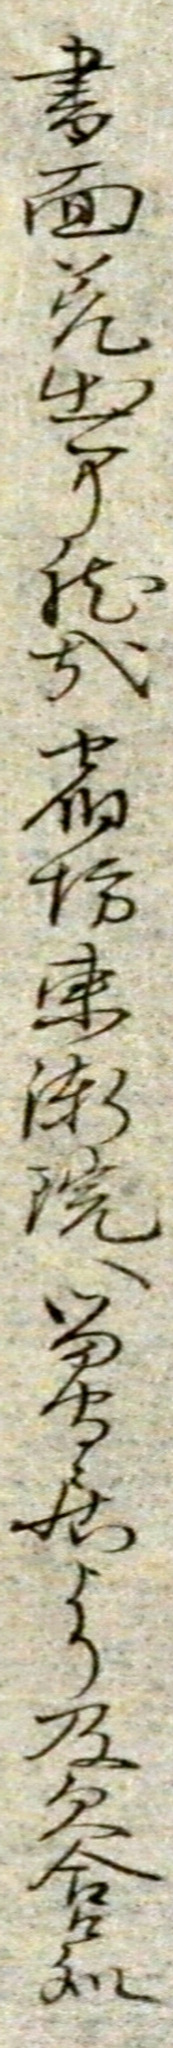書面差出可然哉宿坊東漸院へ留守居より及欠合候処
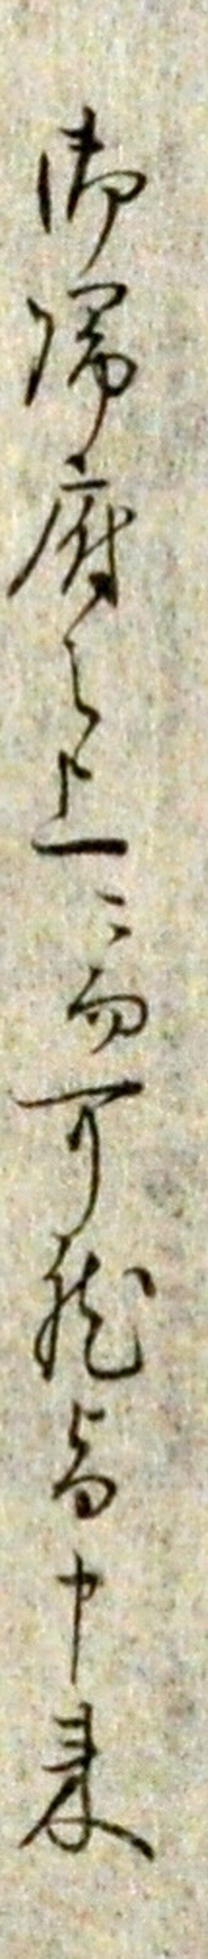御帰府之上ニ而可然旨申来
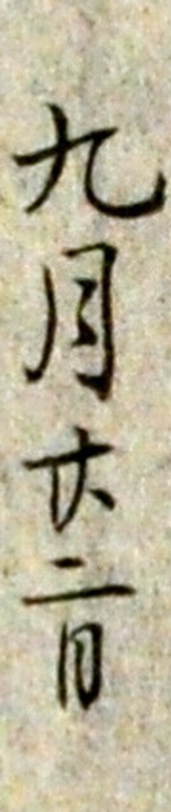九月廿二日
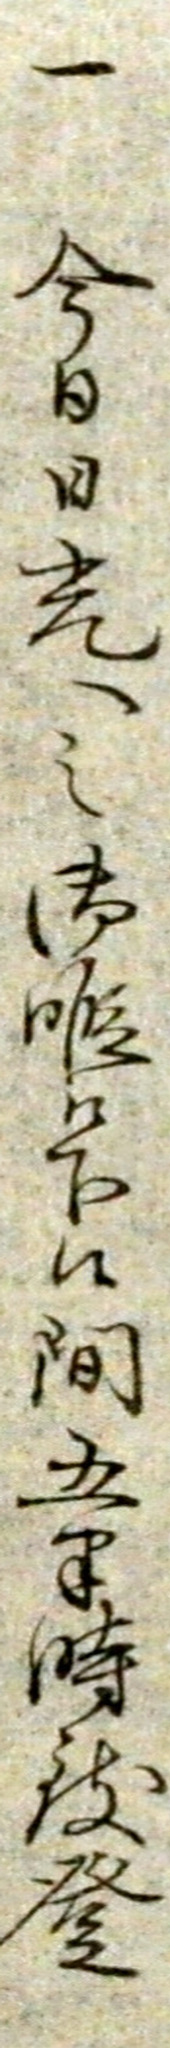一今日日光へ之御暇被下候間五半時致登
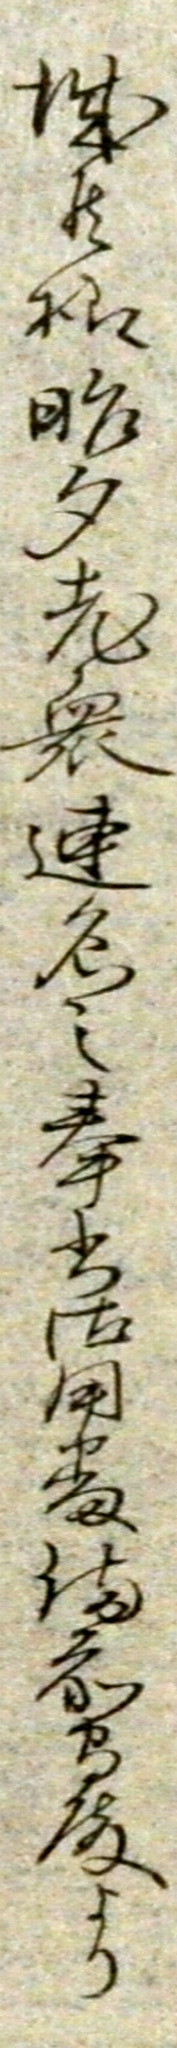城候様昨夕老衆連名之奉書御用番備前守殿より
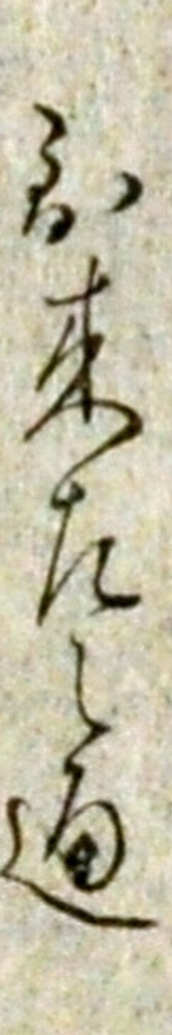到来左之通
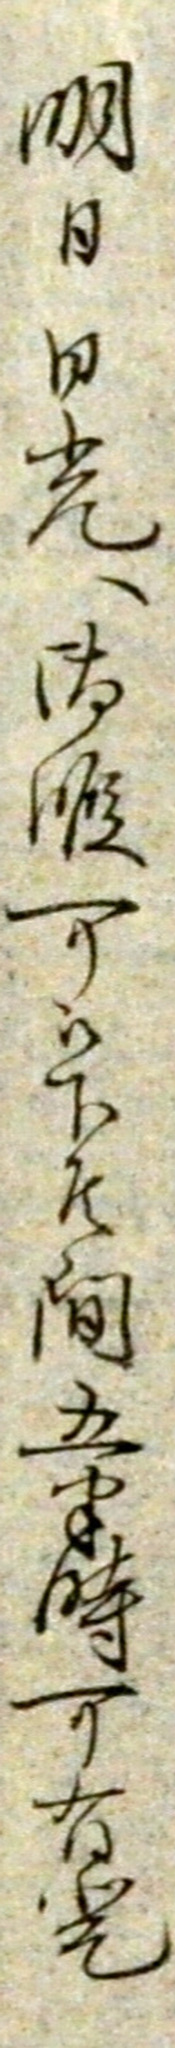明日日光へ御暇可被下候間五半時可有登
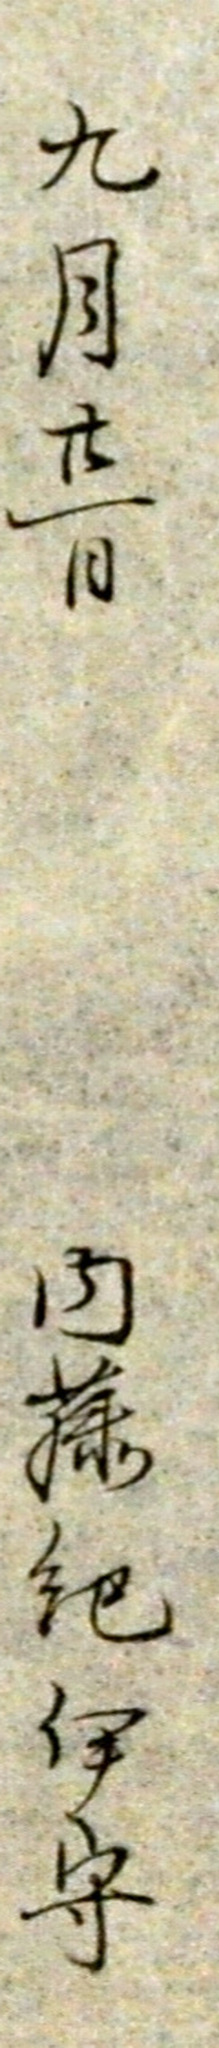九月廿一日内藤紀伊守
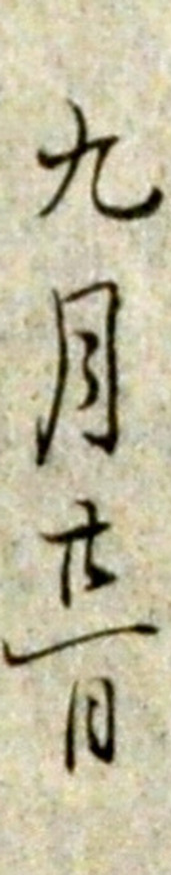九月廿二日
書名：日光御名代相勤候節ノ留
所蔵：伊那市立高遠町図書館・合同会社AMANE
